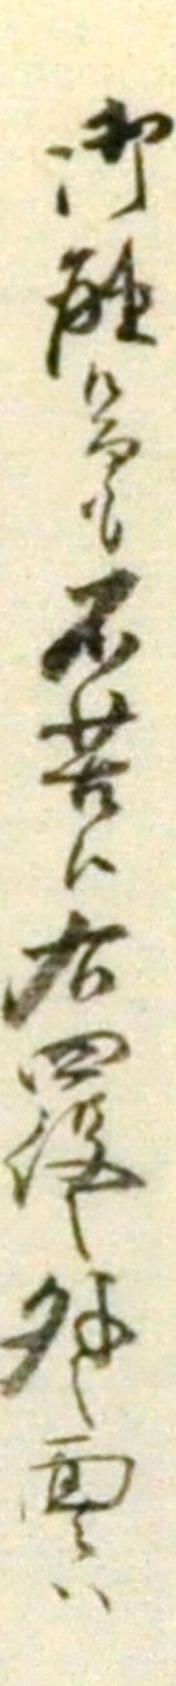御聴候而も不苦候右四役之外之面々ハ
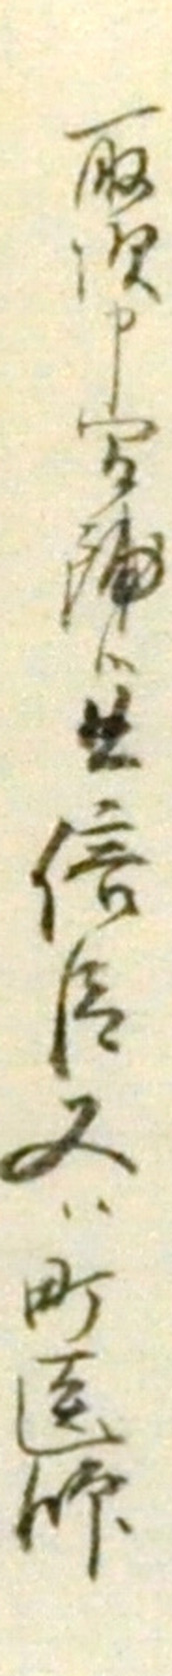取次申間鋪候共倍臣又ハ町医師
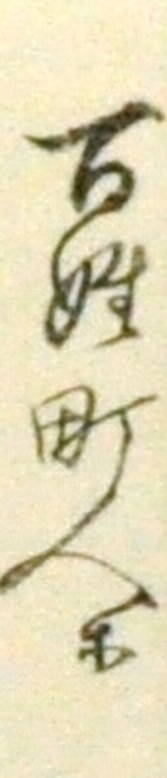百姓町人等
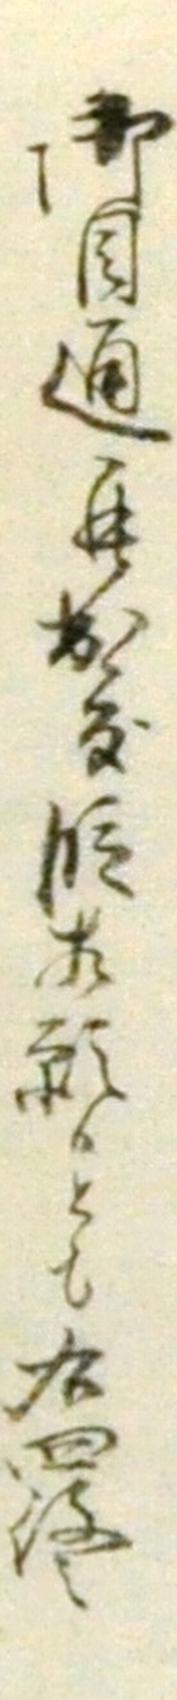御目通罷出度段相願候とも右四役之
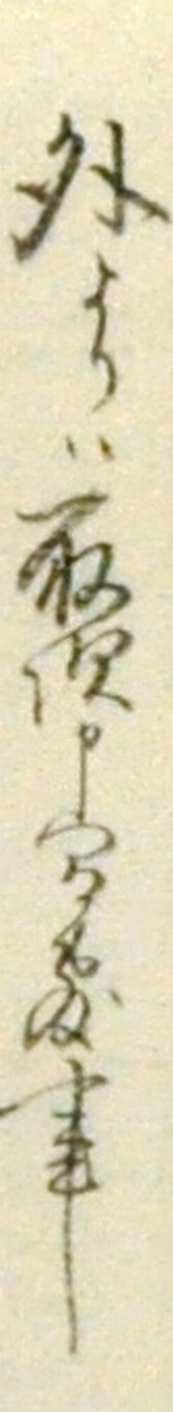外よりハ取次申間敷事
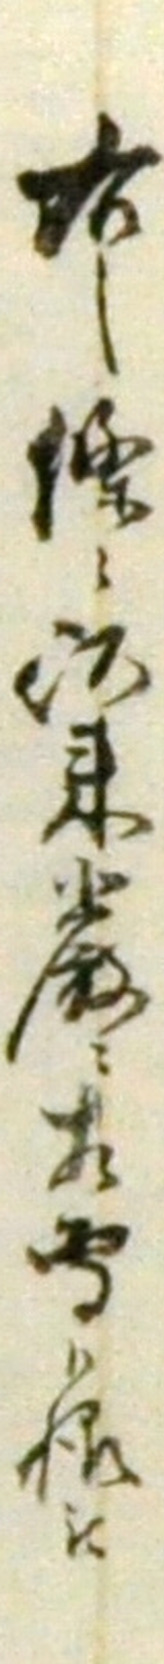右之條々以来厳ニ相守候様被
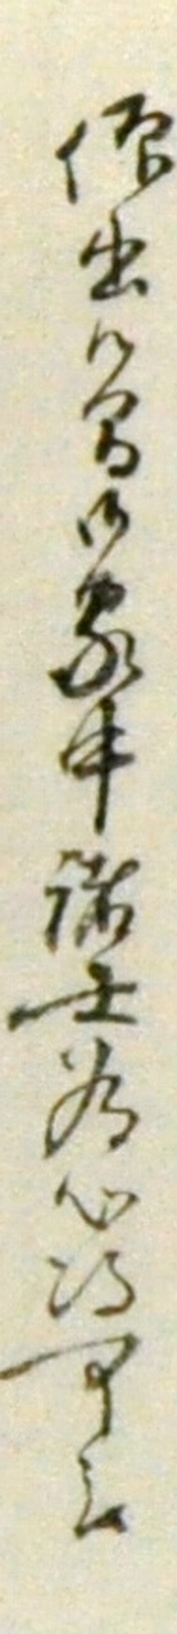仰出候間御家中諸士為心得可被
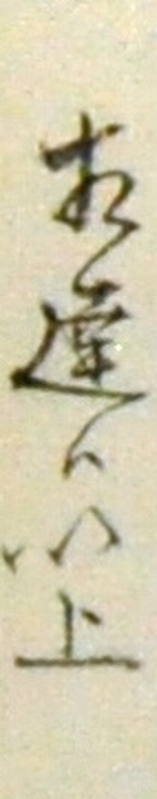相達候以上

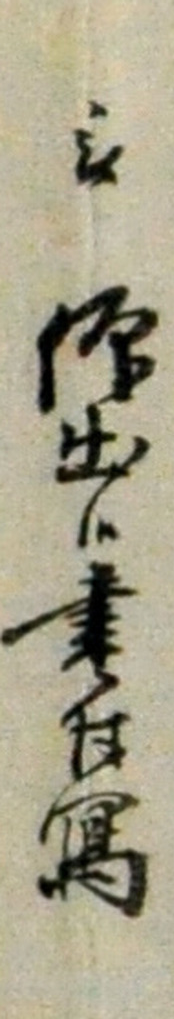被仰出候書付写
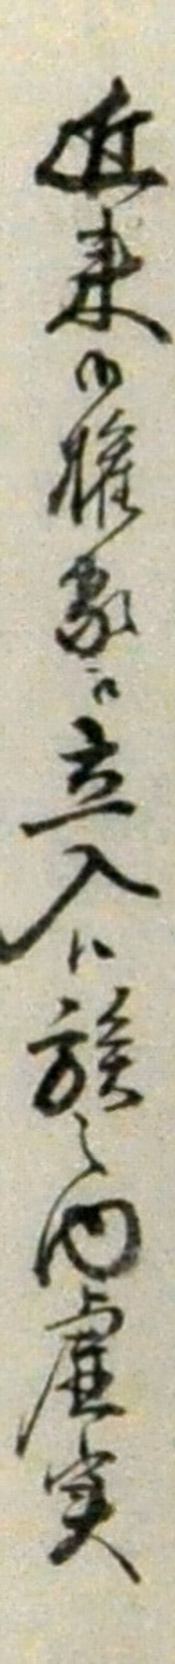近来御権家江立入候族之内虚実
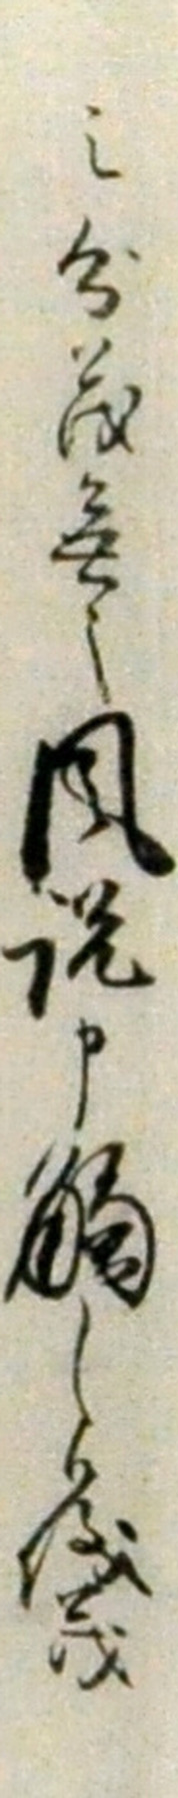之分茂無之風説申触之候儀茂
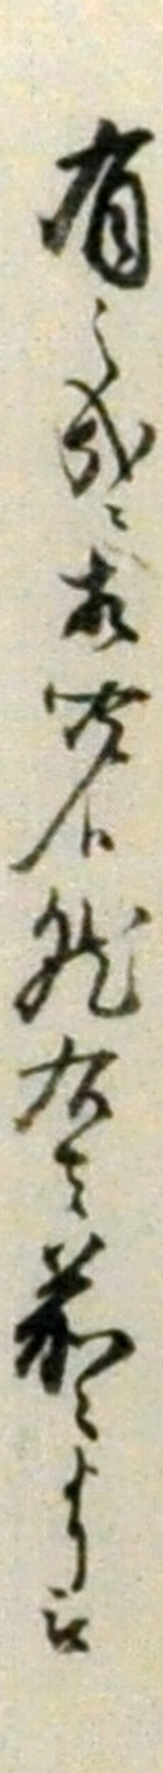有之哉ニ相聞候就右者前々より被
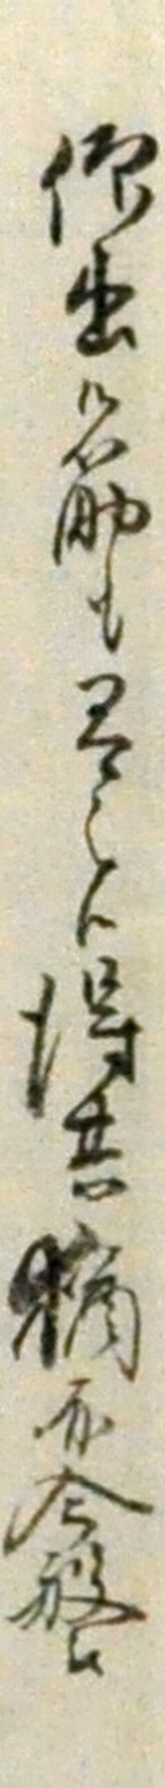仰出候筋も有之候得其猶亦今般被
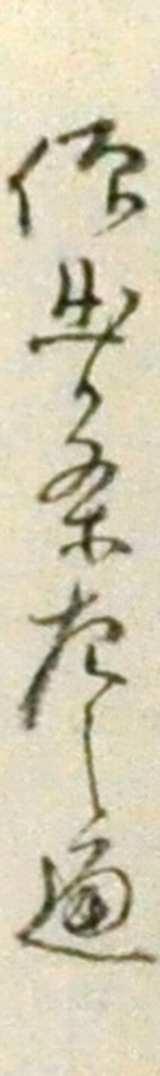仰出候条左之通
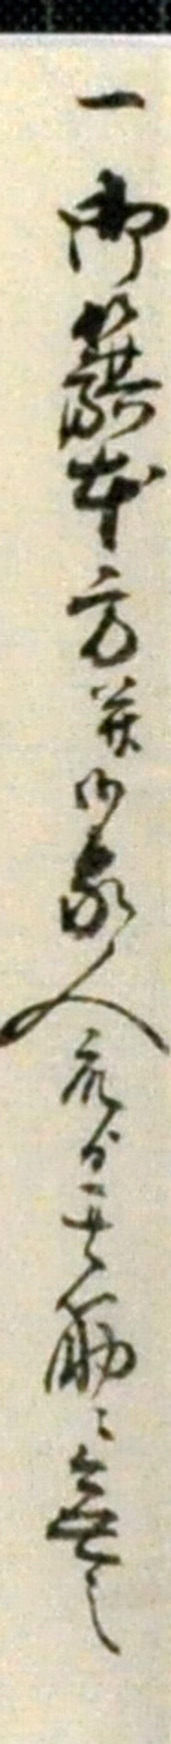一御籏本方并御家人衆ゟ其筋ニ無之
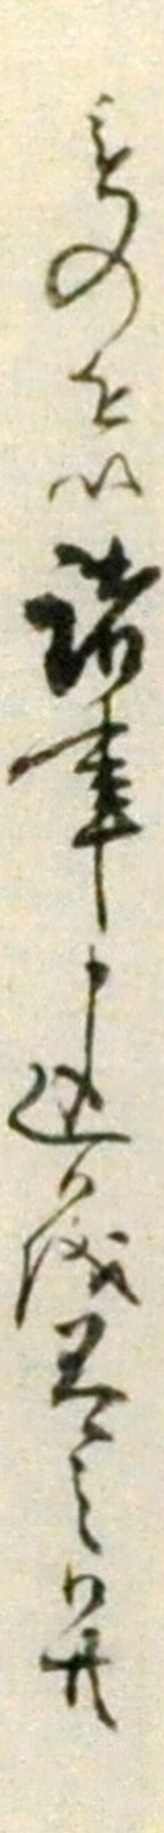ものを以諸事申込候儀有之候共
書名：家中触
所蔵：伊那市立高遠町図書館・合同会社AMANE
